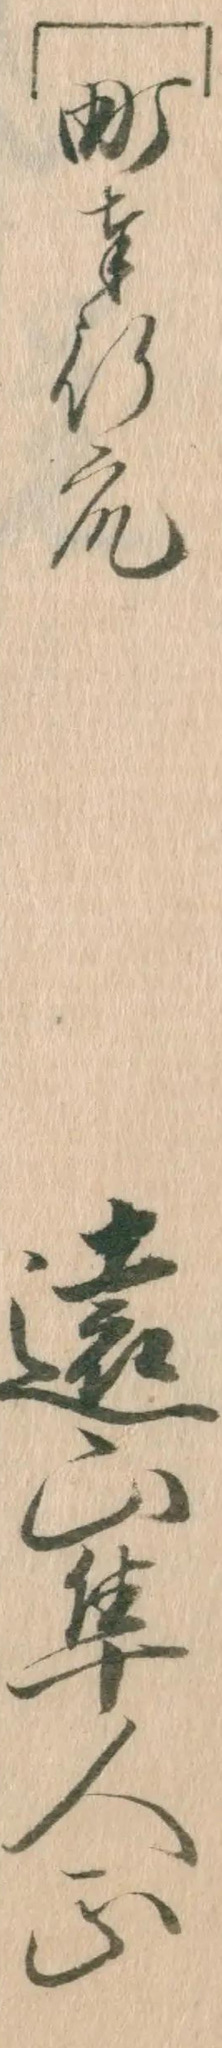│[町奉行衆遠山隼人正
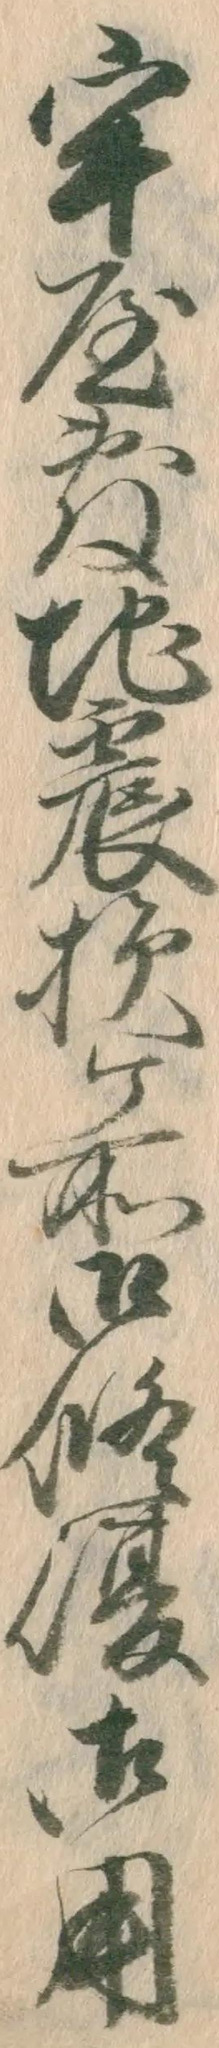牢屋敷地震損ケ所御修復御用
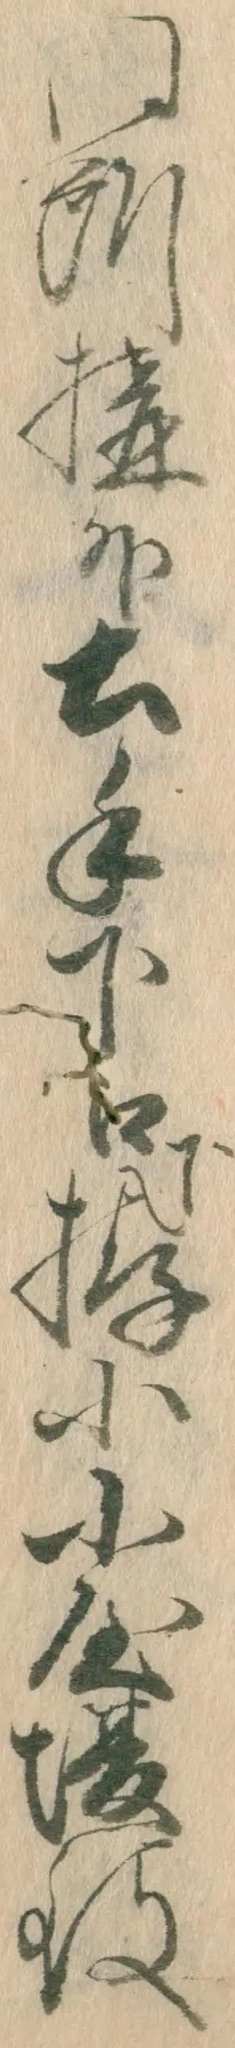同所構外土手下御下拵小小屋場致

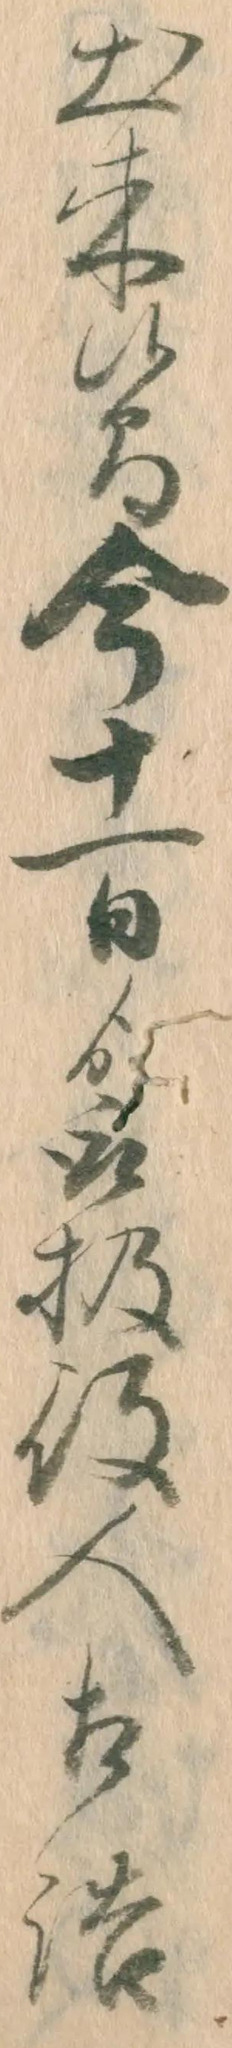出来候間今十一日ゟ取扱役人相詰
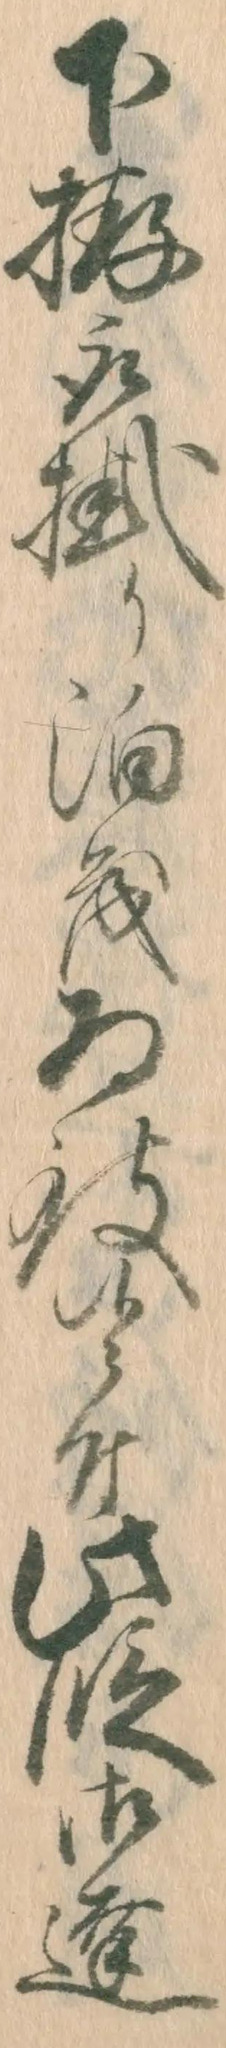下拵取掛り泊も為致候ニ付此段御達
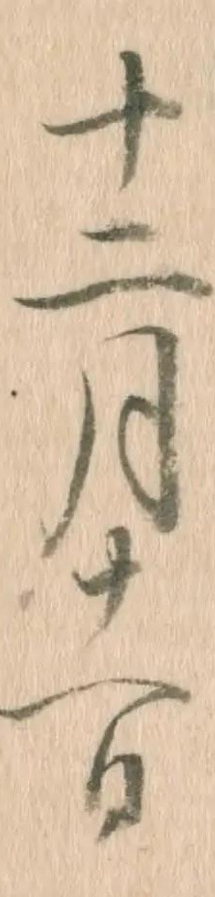十二月十一日
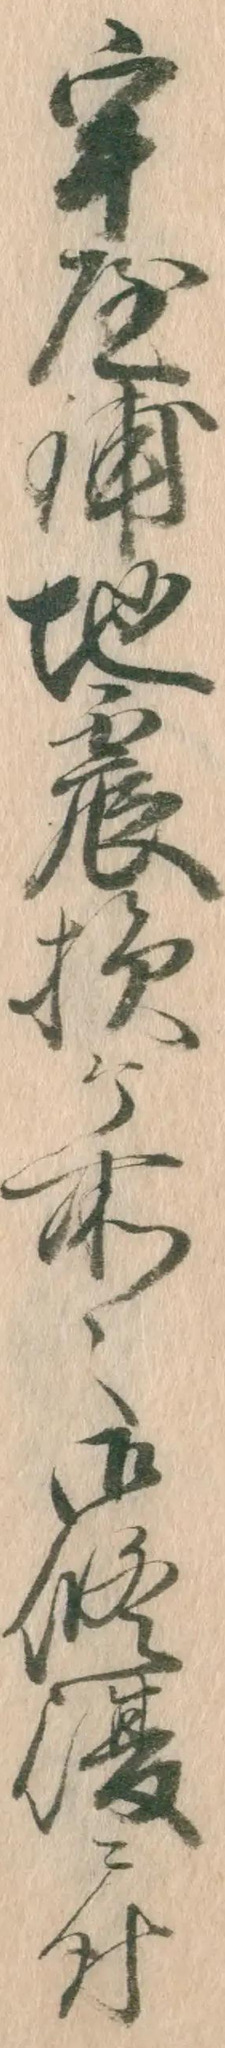牢屋敷地震損ケ所之御修復ニ付
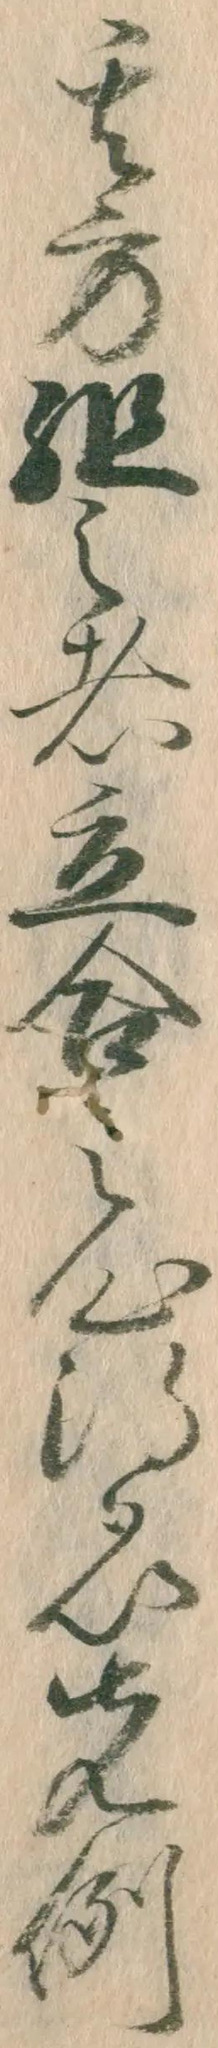其方組之者立合之心得ヲ以先例

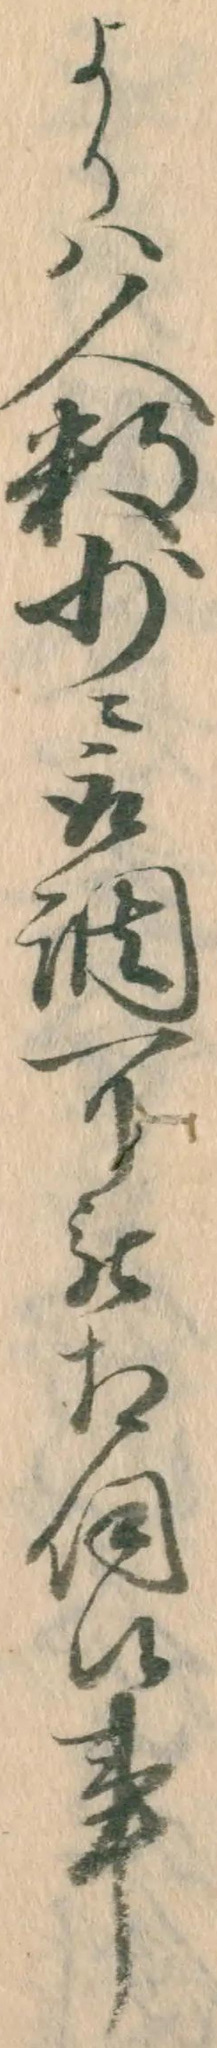よりハ人数少ニ取調可被相伺候事
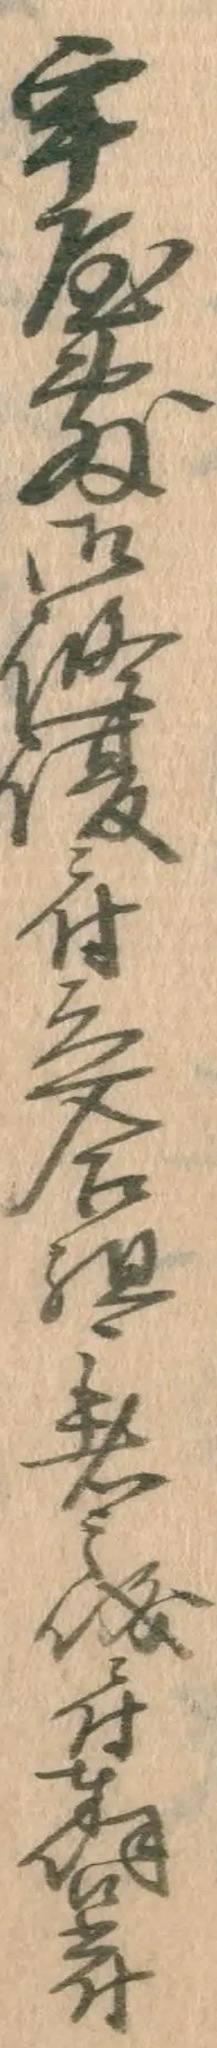│牢屋敷御修復ニ付立合組之者之儀ニ付奉伺候書付
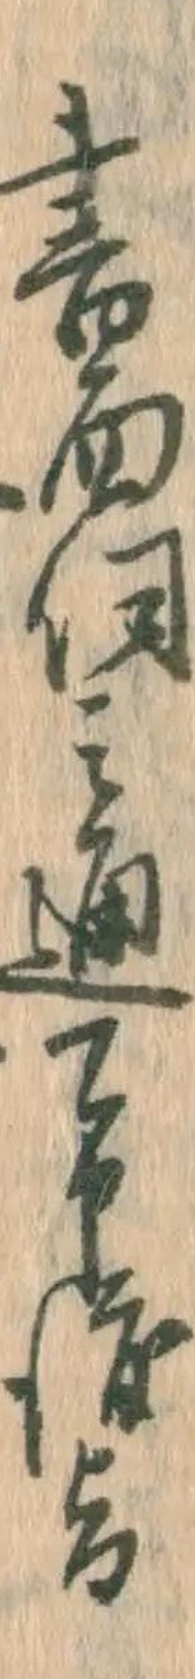│書面伺之通可申渡旨
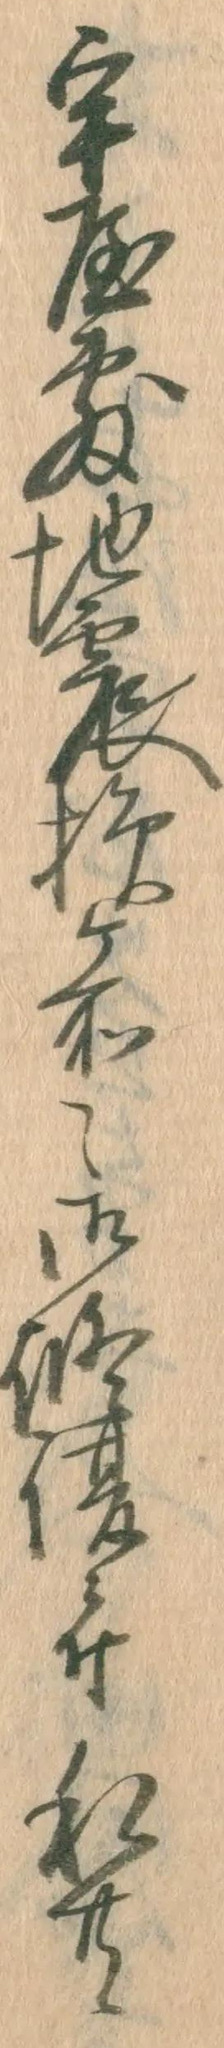牢屋敷地震損ケ所之御修復ニ付私共
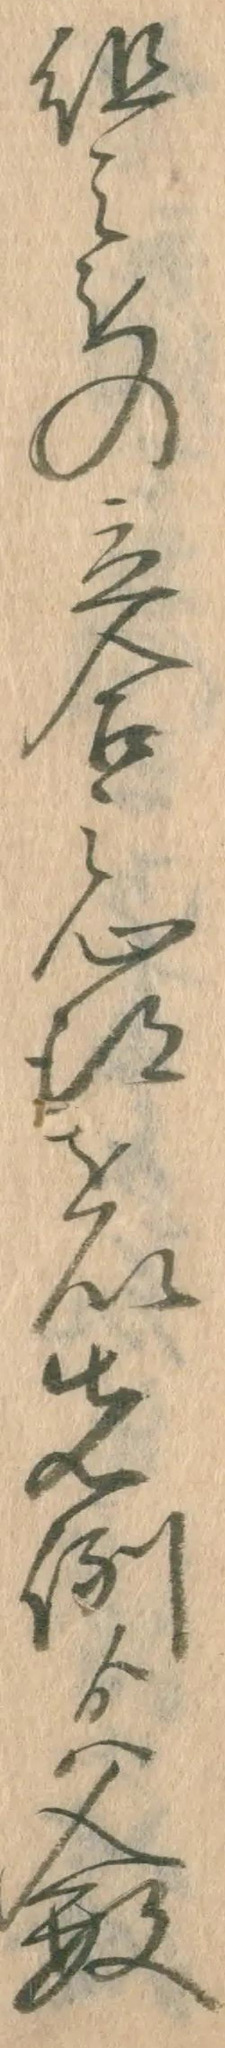組之もの立合之心得を以先例ゟハ人数

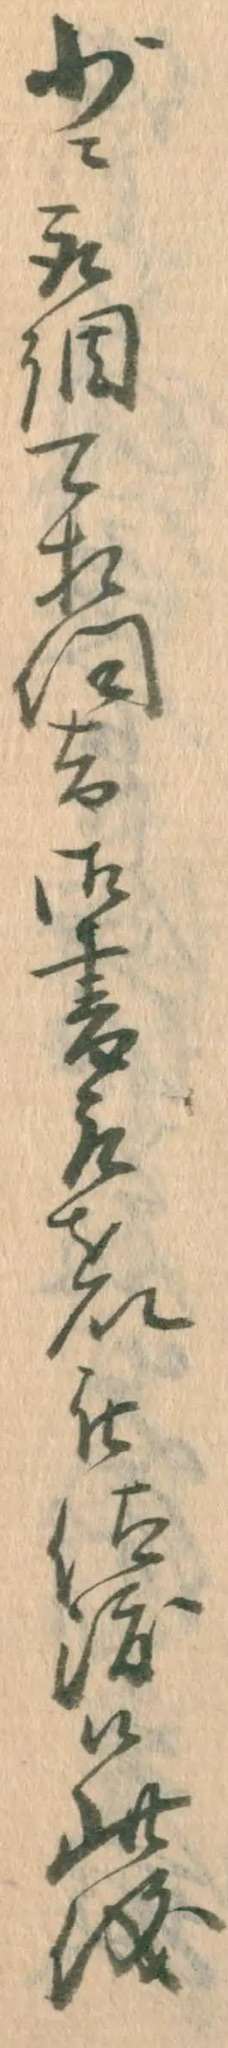少ニ取調可相伺旨御書付を以被仰渡候此儀
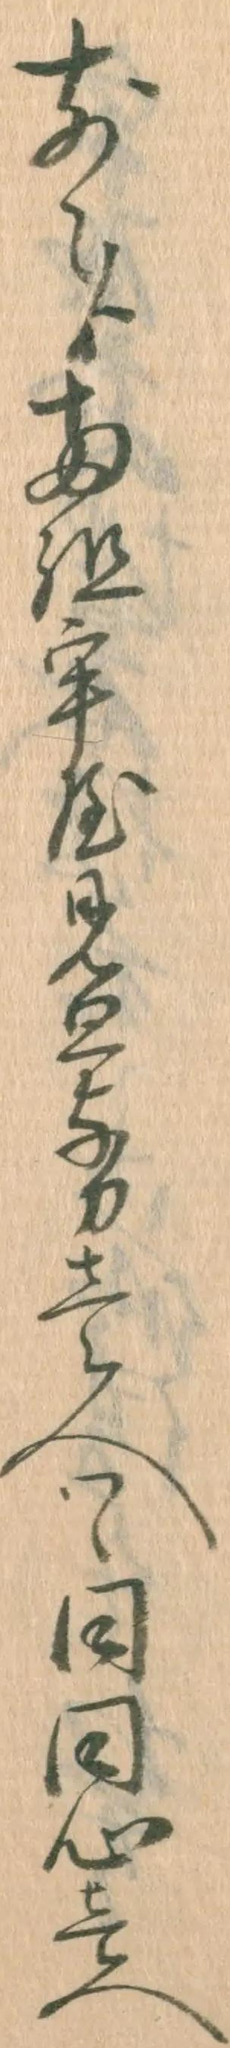前〻ゟ両組牢屋見廻与力壱人ツヽ同同心壱人
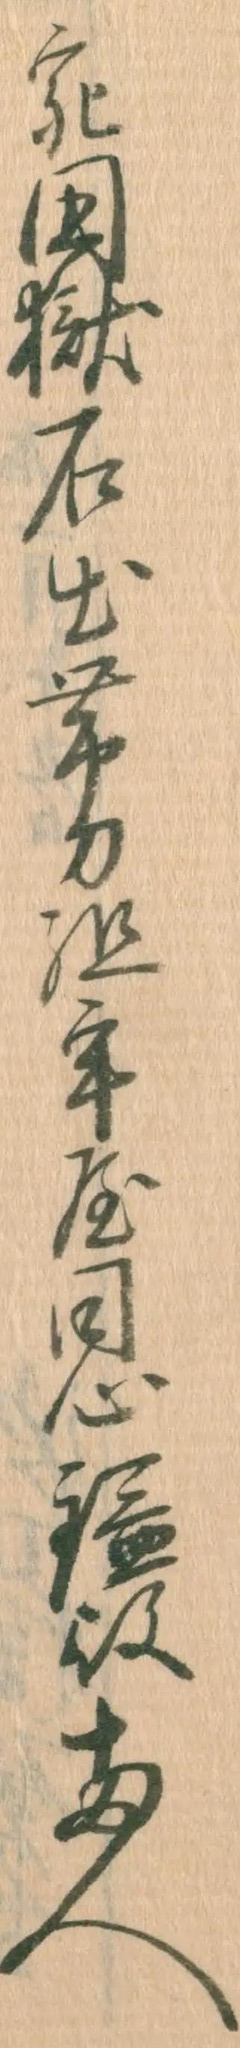宛囚獄石出帯刀組牢屋同心鎰役両人
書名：七十冊物類集 71巻. [44] 四十三 牢屋敷御普請御修覆地震ニ付骨折候牢屋掛御褒美之部
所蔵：国立国会図書館 National Diet Library, JAPAN
